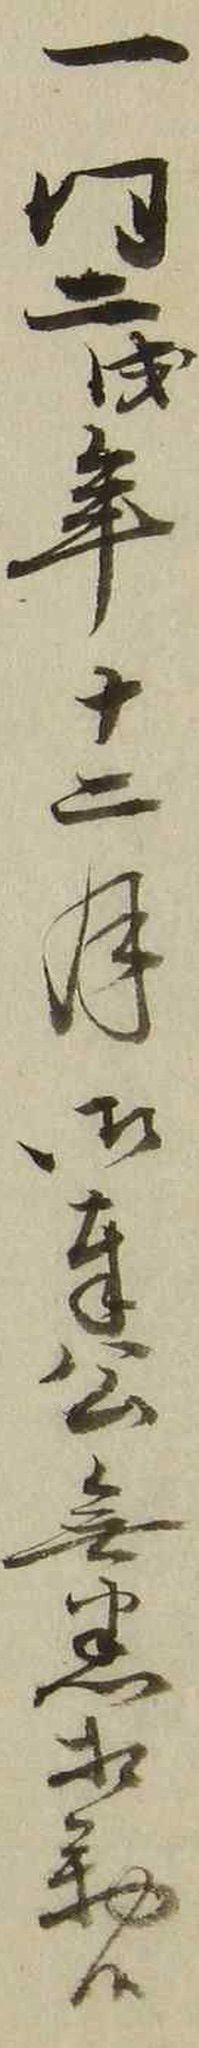一同二戌年十二月御奉公無恙相勤候
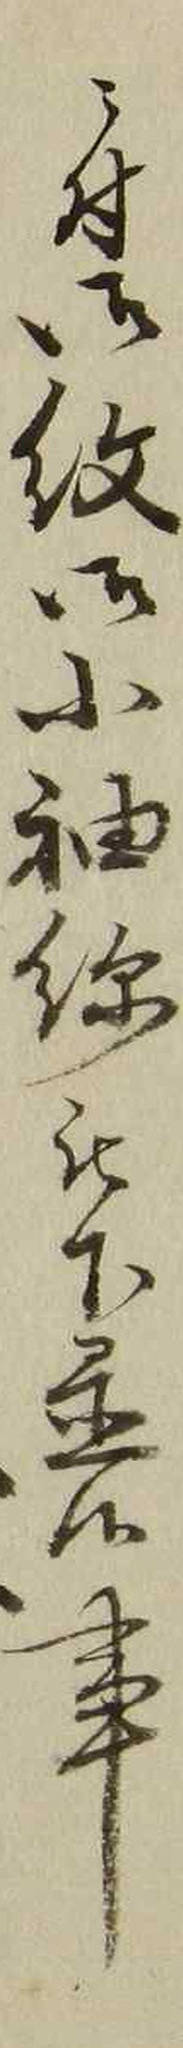ニ付御紋御小袖綿被下置候事
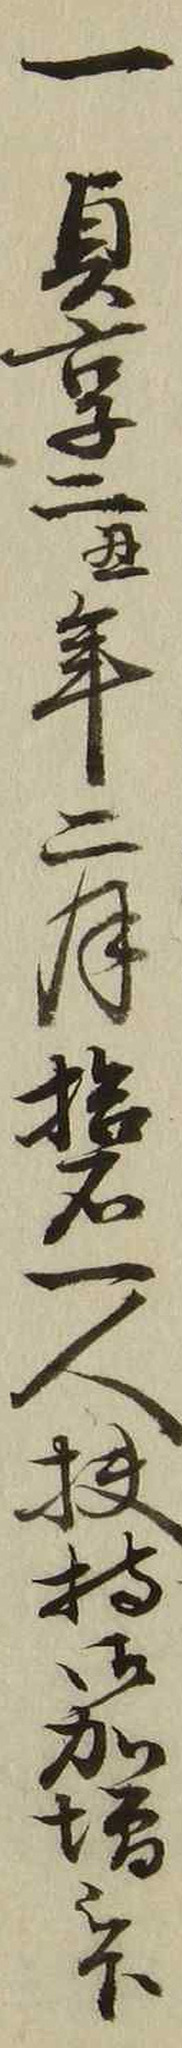一貞享二丑年二月拾石一扶持御加増被下
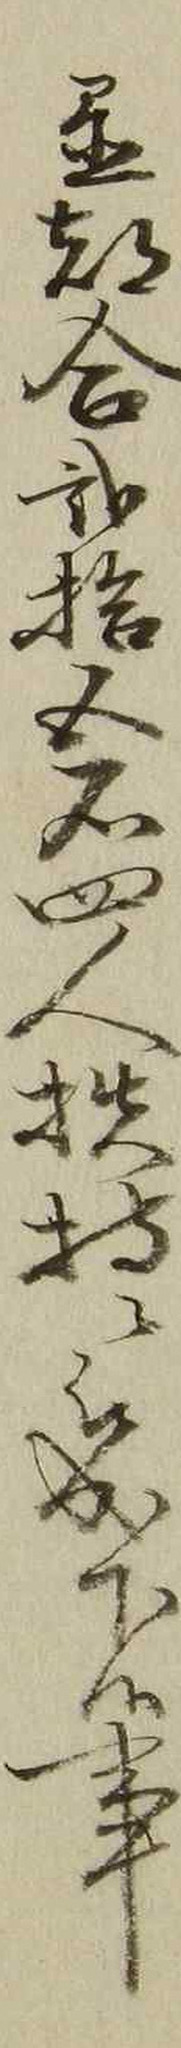置都合弐拾五石四人扶持ニ被成下候事
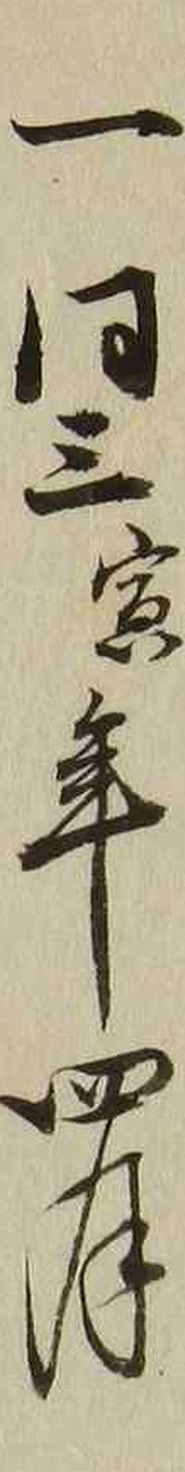一同三寅年四月
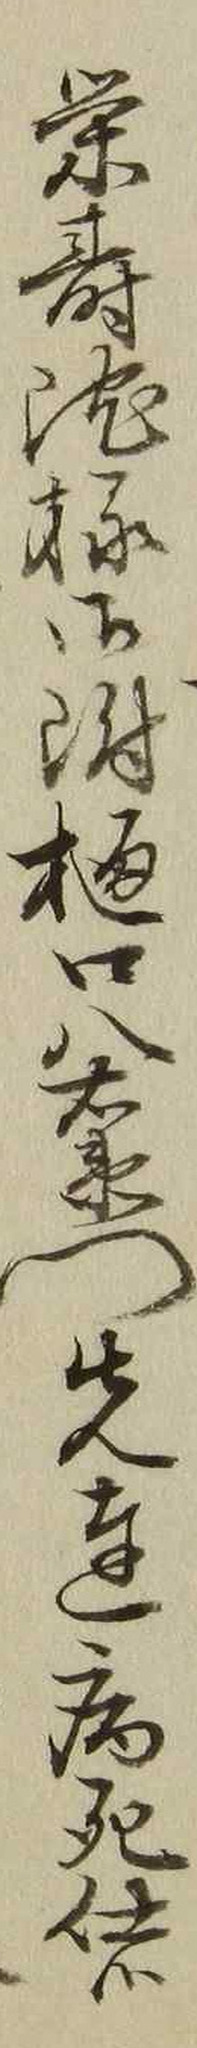栄寿院様御附樋口八右衛門先達病死仕候
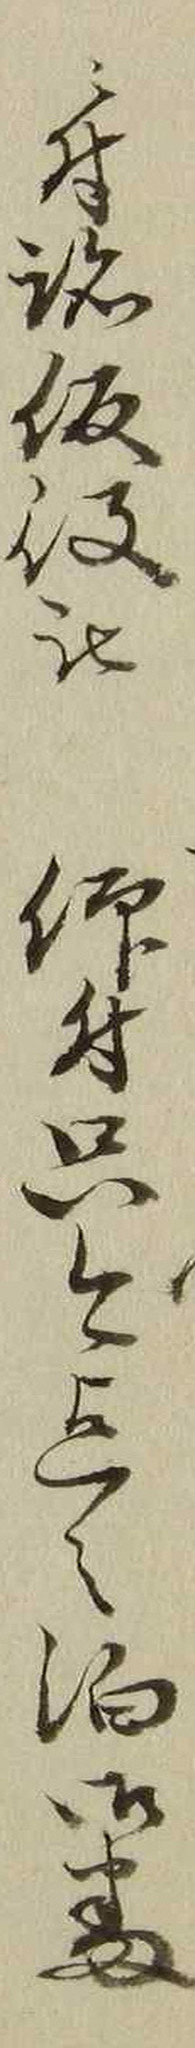ニ付跡仮役被仰付只今迄之泊御番
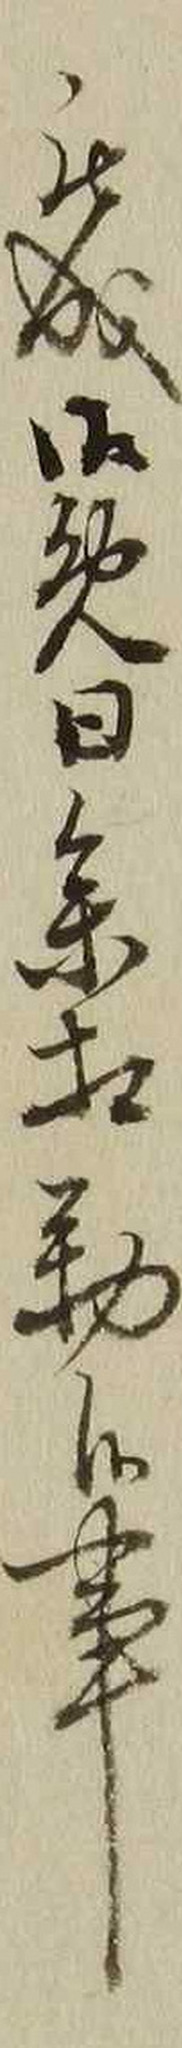被成御免日参相勤候事
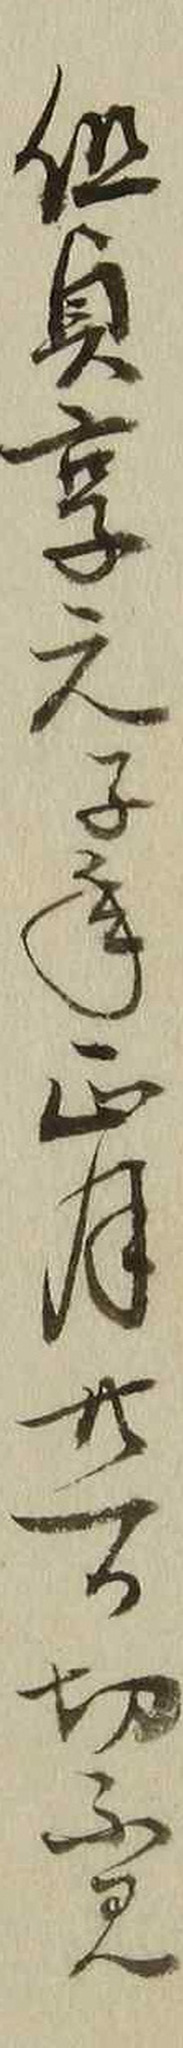但貞享元子年正月廿一日功不見
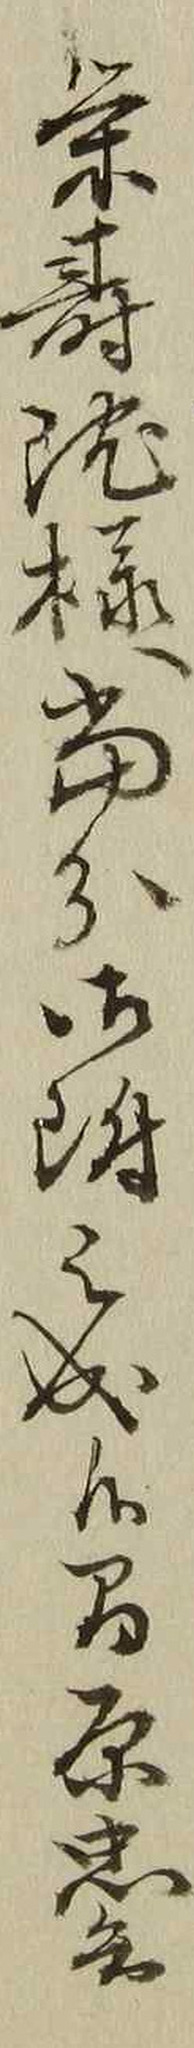栄寿院様へ当分御附被成候間原忠兵
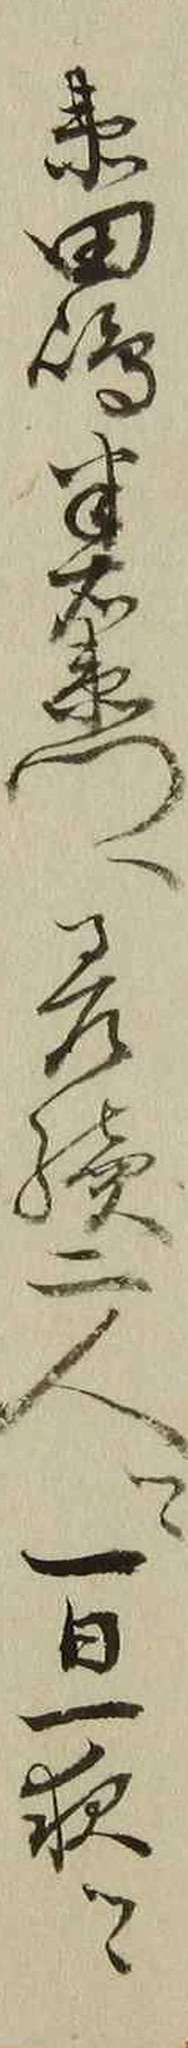衛田島半右衛門へ差続二人ツヽ一日一夜ツヽ
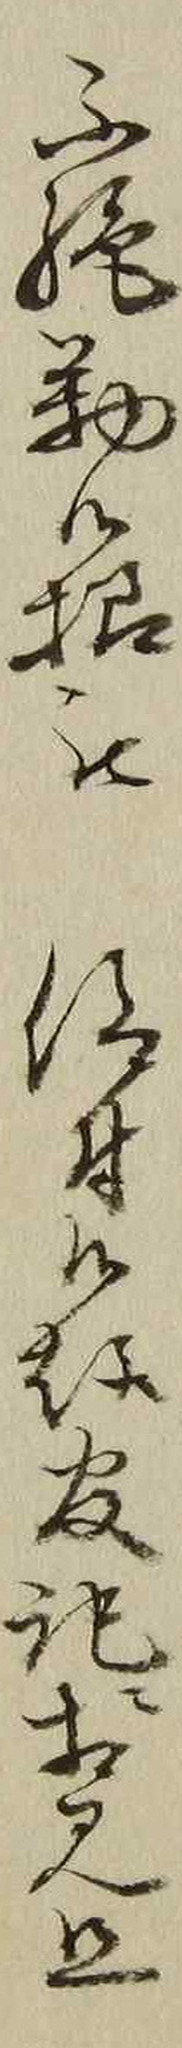不絶勤候様被仰付候趣官記ニ相見且
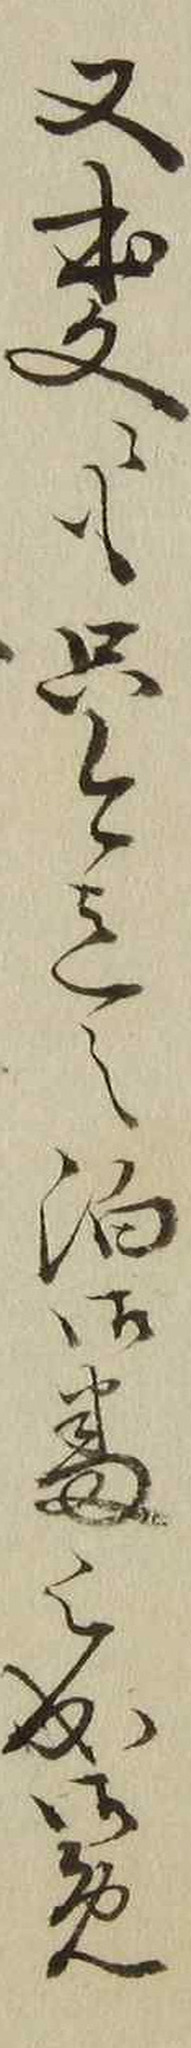又本文ニも只今迄之泊御番被成御免
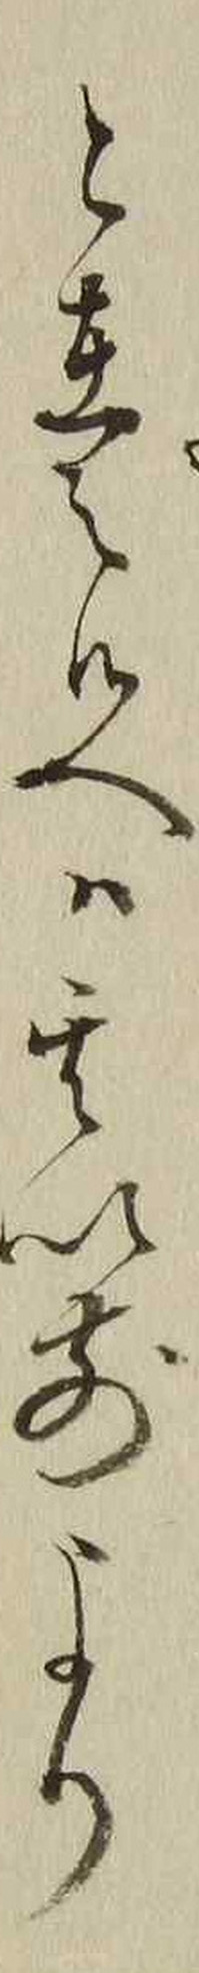と在之候へハ其以前より
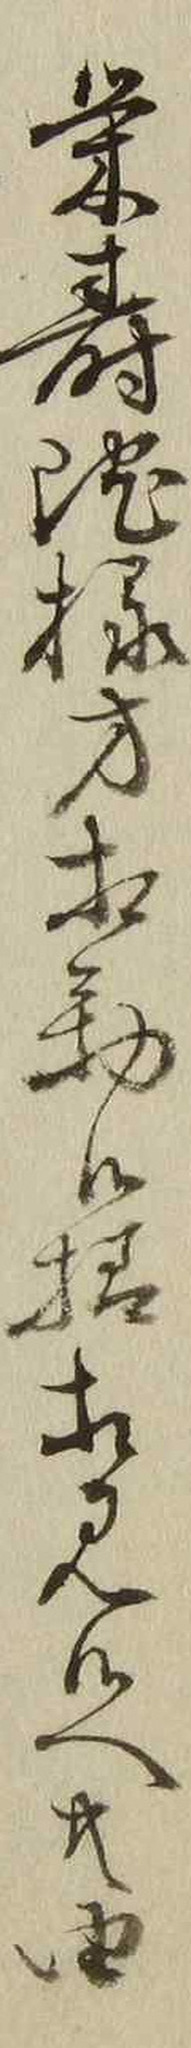栄寿院様方相勤候様相見候へ共由
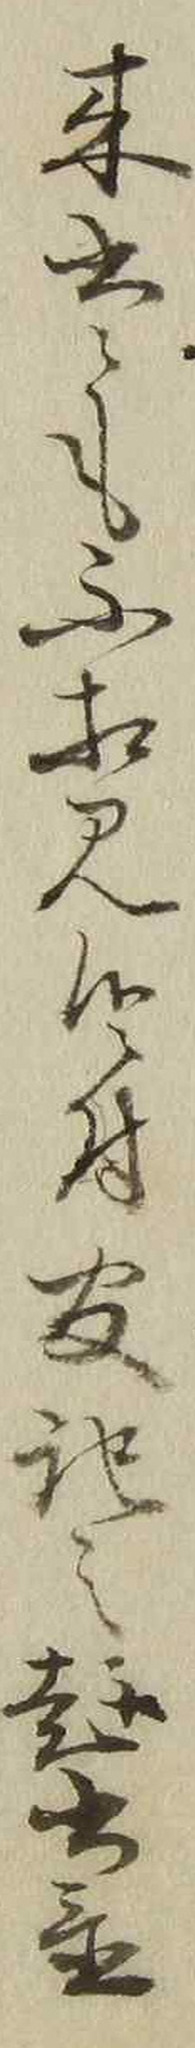来書ニも不相見候ニ付官記之趣書置
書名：諸士系譜　巻之36　は之部4
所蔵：会津若松市立会津図書館
